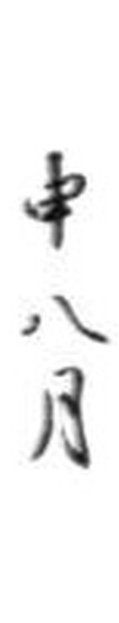申八月
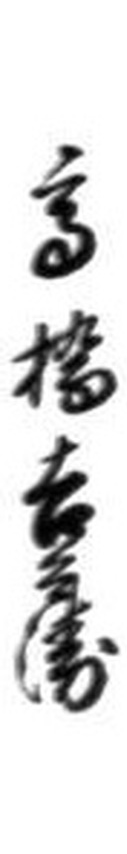高橋吉兵衛
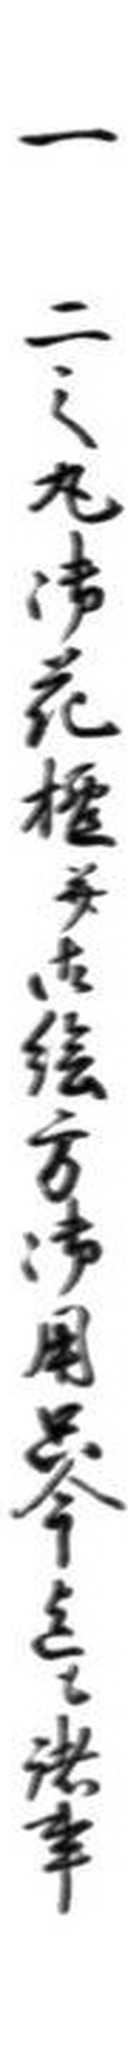一二ノ丸御花檀并御得絵方御用只今迄も諸事
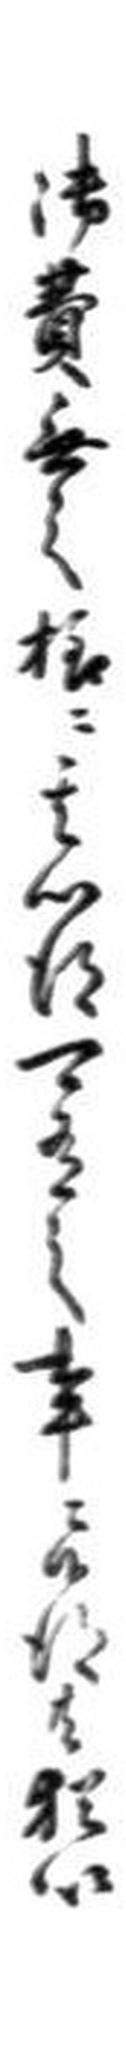御費無之様ニ其心得可有之事ニ候得共猶以
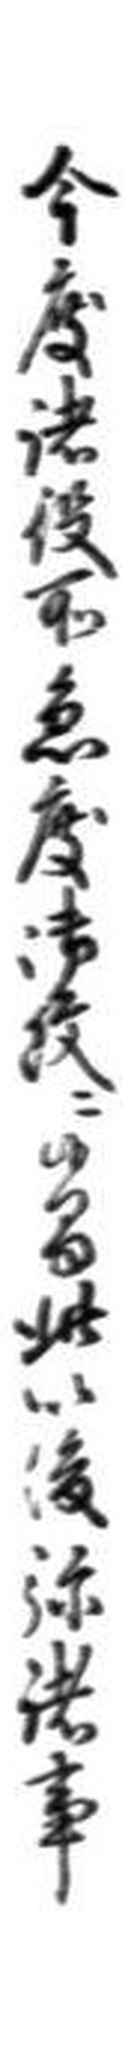今度諸役所急度御改ニ候間此以後弥諸事
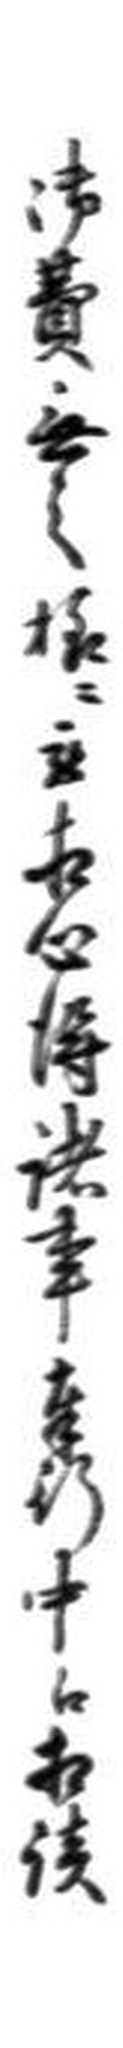御費無之様ニ被相心得諸事奉行中江相談
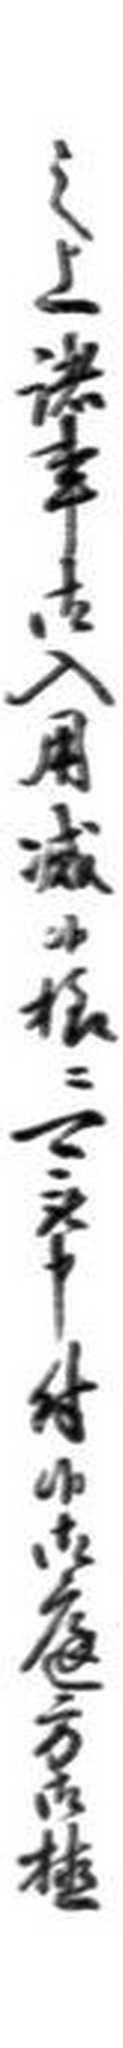之上諸事御入用減候様ニ可被申付候御庭方御植
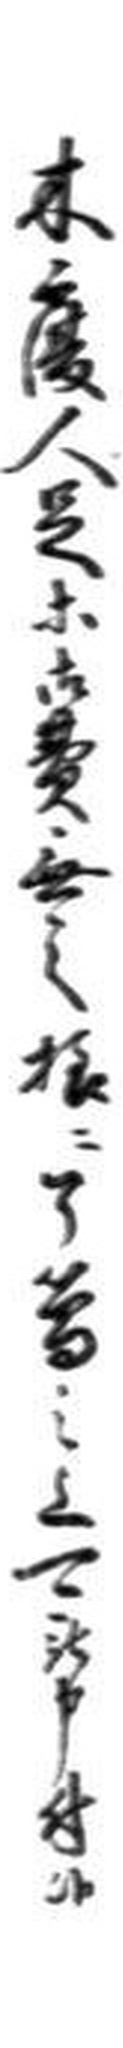木覆人足等御費無之様ニ了簡之上可被申付候
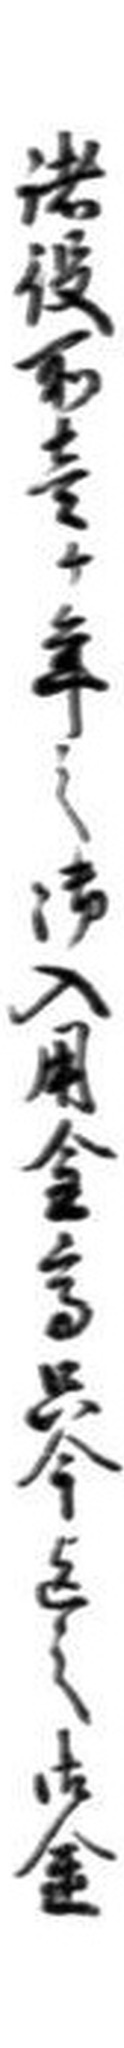諸役所壱ヶ年之御入用金高只今迄之御金
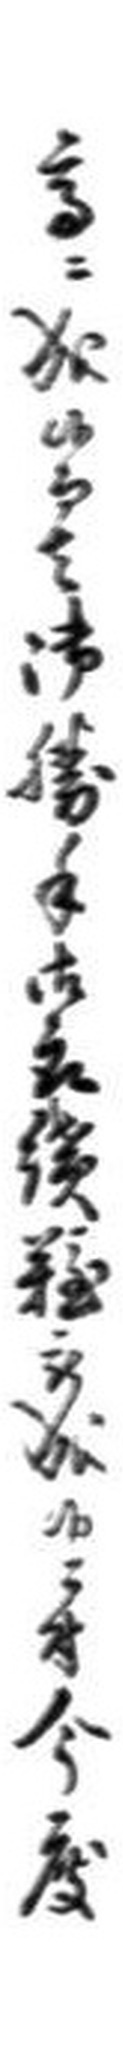高ニ成候而者御勝手御取続難被成候ニ付今度

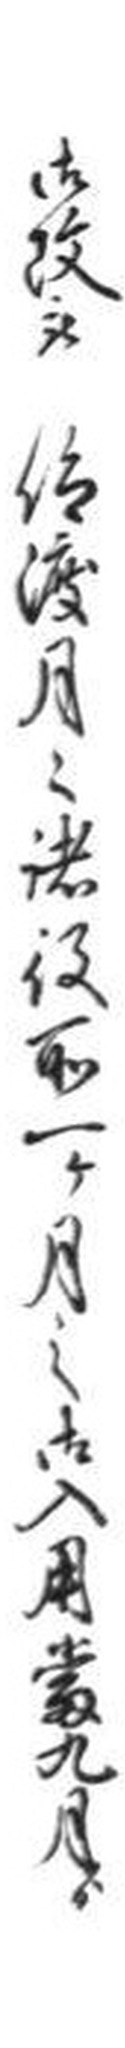御改被仰渡月々之諸役所一ヶ月之御入用当九月ゟ
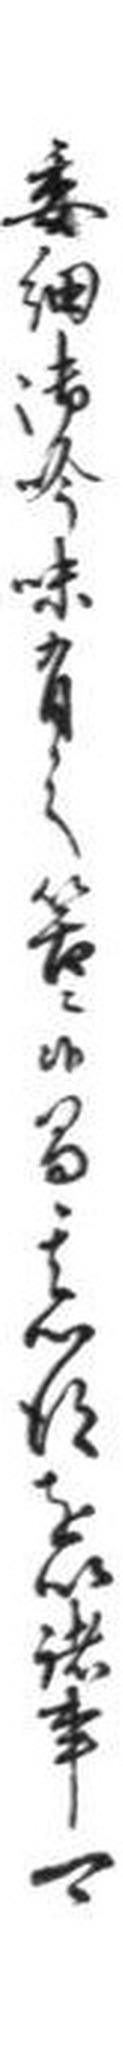委細御吟味有之筈ニ候間其心得を以諸事可
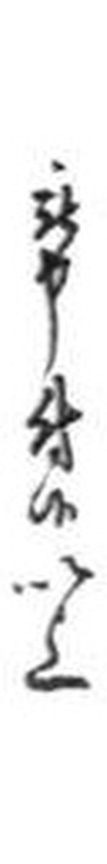被申付候以上
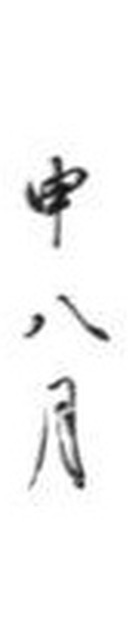申八月
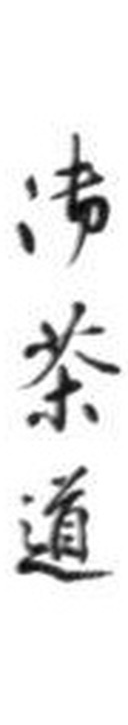御茶道
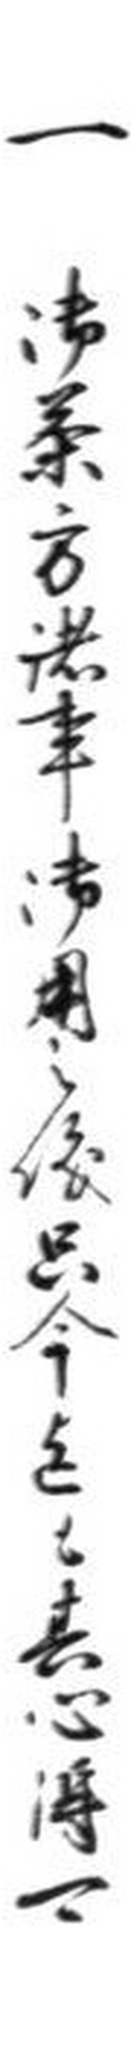一御茶方諸事御用之儀只今迄も其心得可
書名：家譜 三十一 吉邦公 享保元年
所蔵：福井県文書館 Fukui Prefectural Archives
